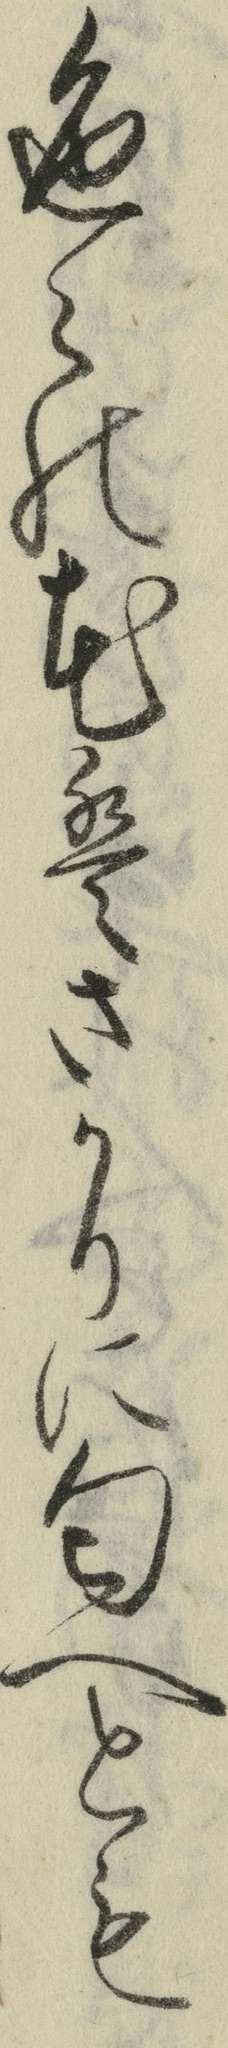色々の花はさかりに匂へとも
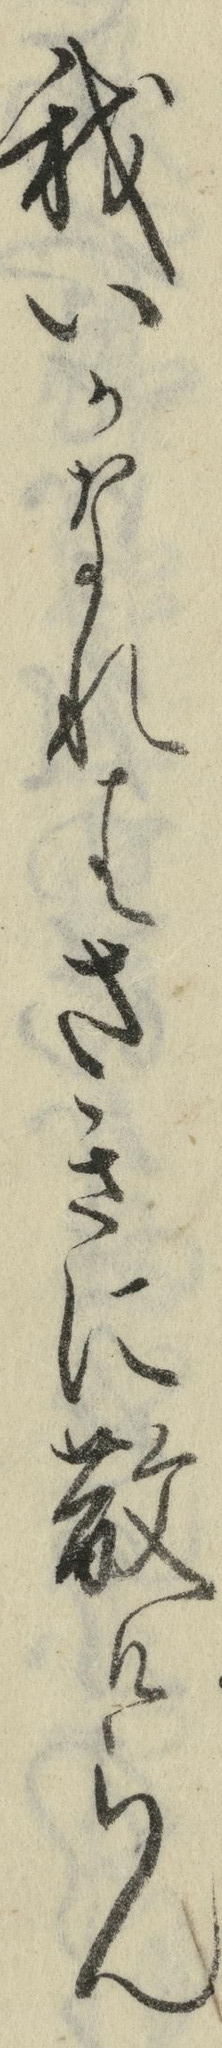我いかなれはさきに散
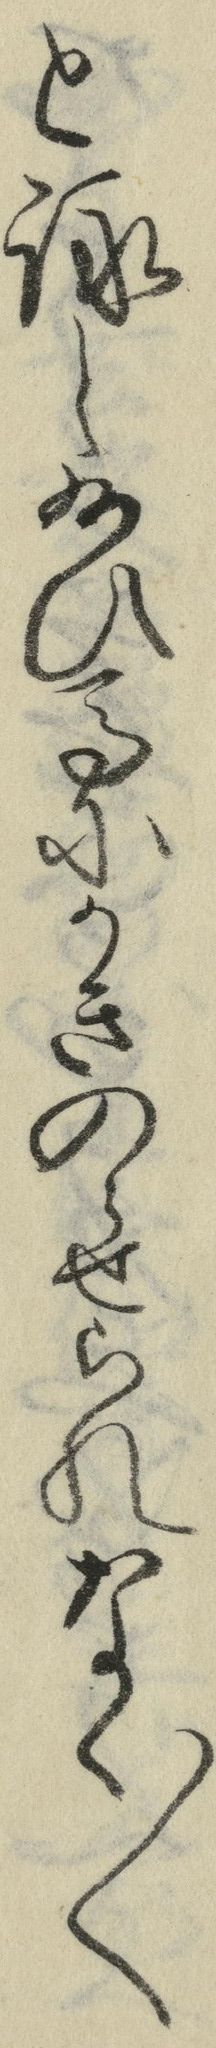と詠し給ひ馬にかきのらせられなく〳〵
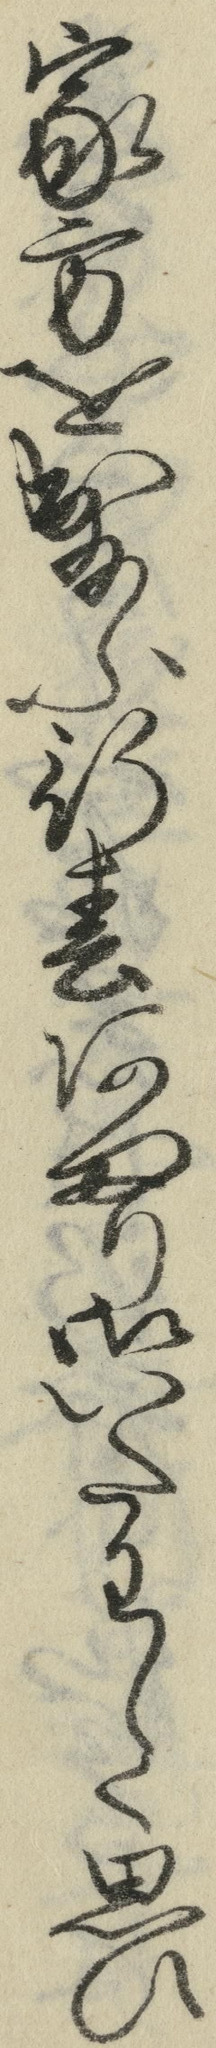家方を出給ふ行春あまり御いたわしく思ひ
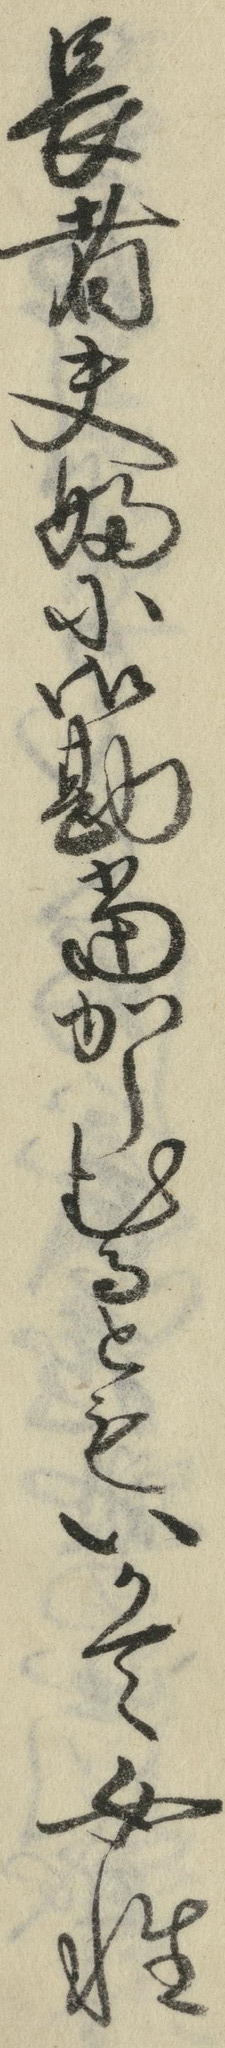長者夫婦に御勘当かうむるともいかて女性
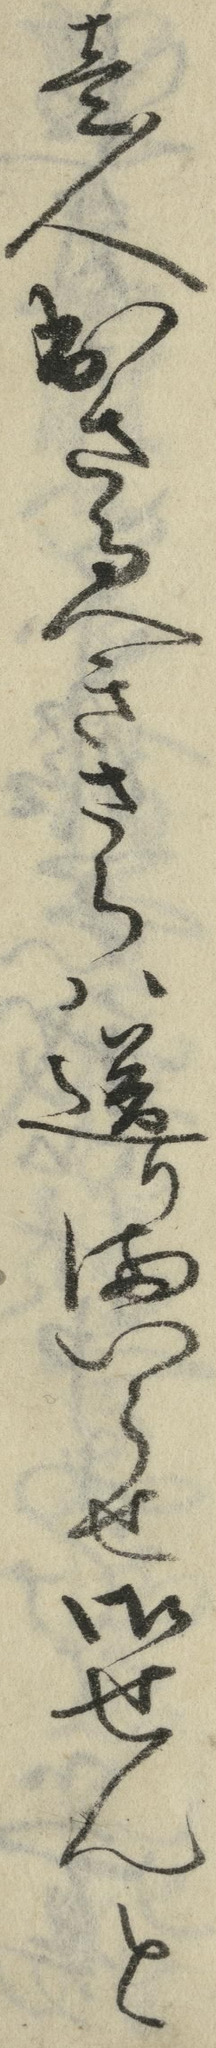壱人出さるへきさらは送御せんと
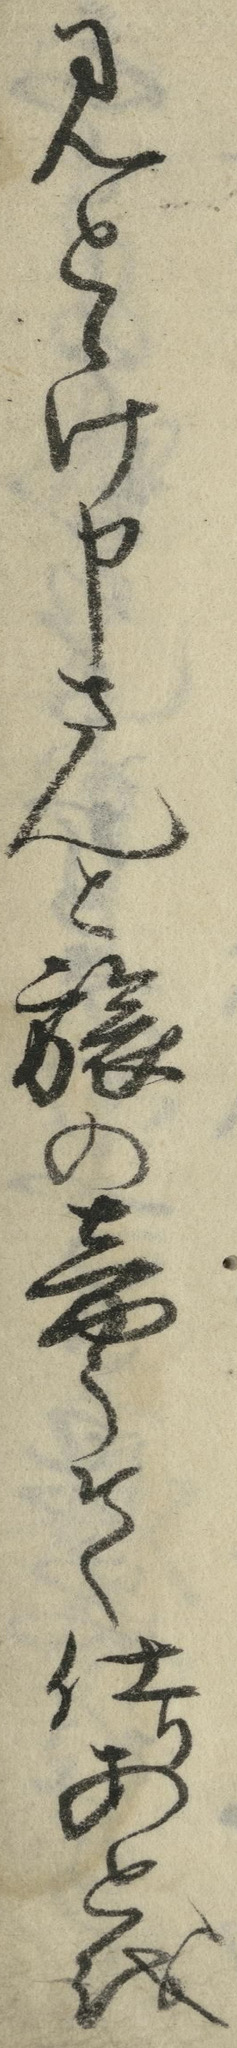見とゝけ申さんと旅のしやうそく仕

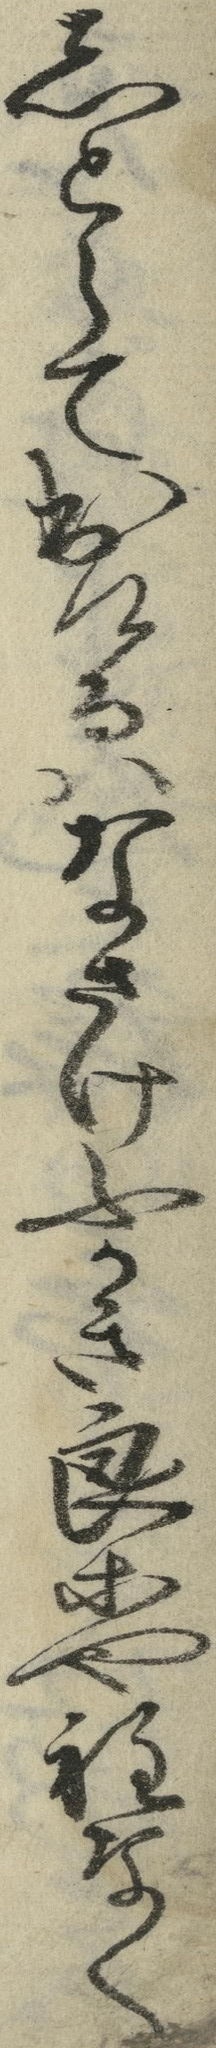しとうて出けるはなさけふかき良等や程なく
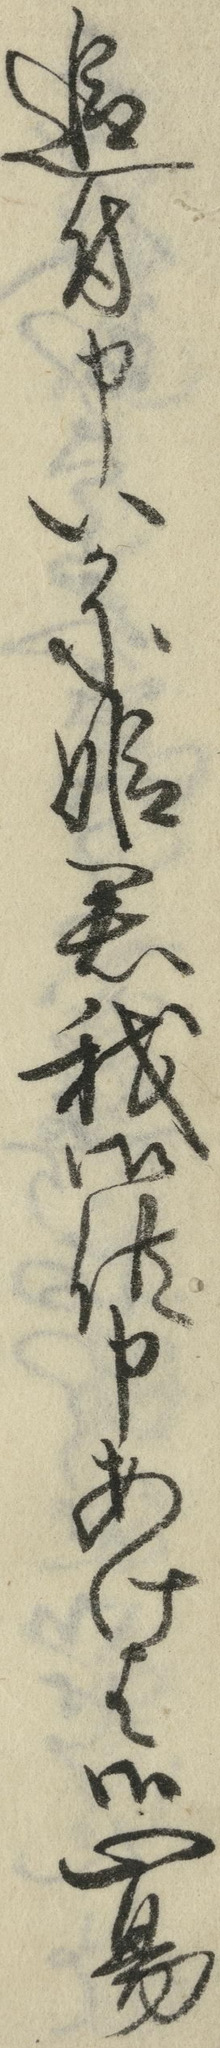追付申すいかに姫君我御供申あけは御心易
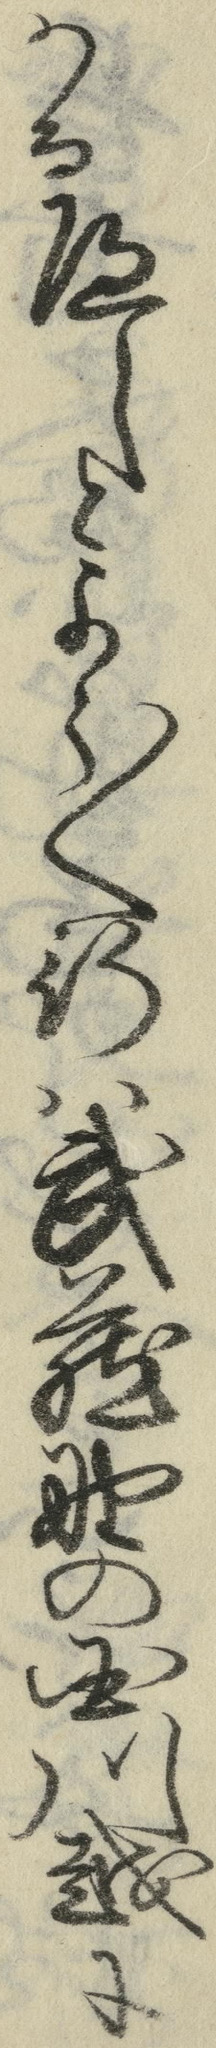かるへしとよう〳〵行は武蔵野の国川越に
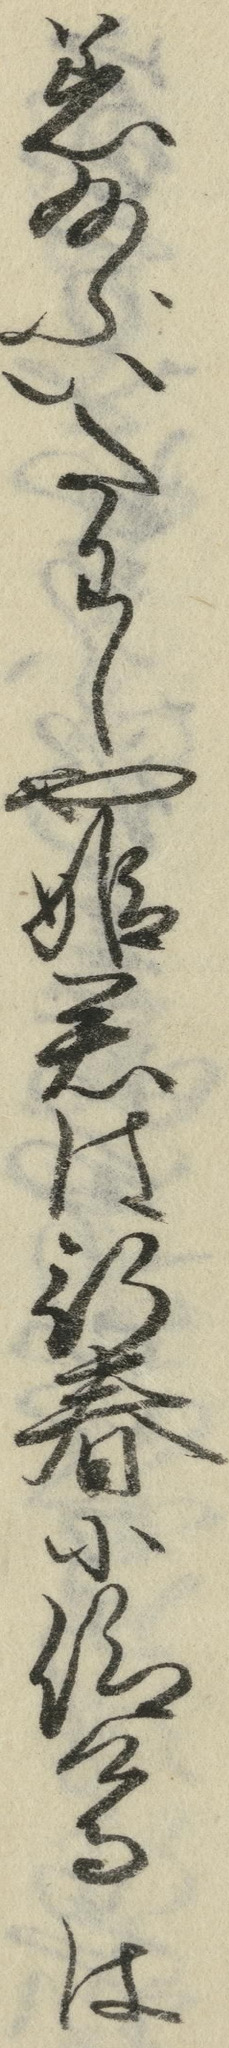着給ふいたわしや姫君は行春に仰けるは
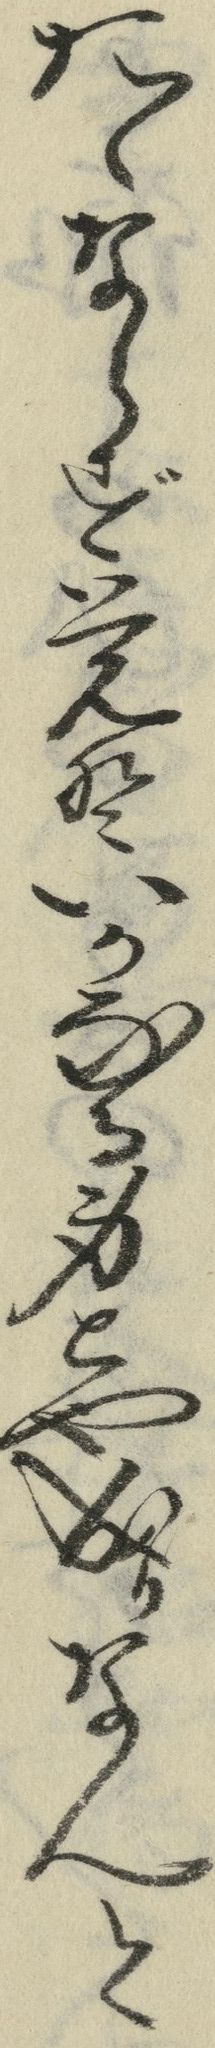たゝならず覚はいかなる身とや成
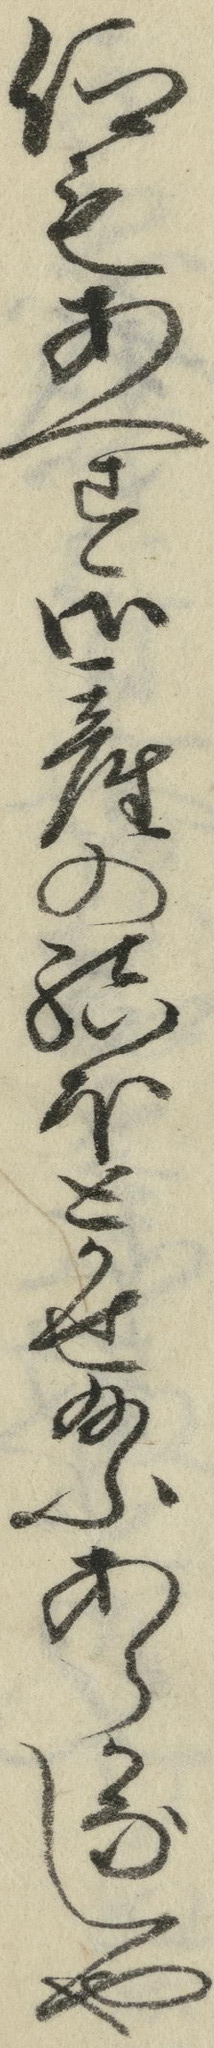仰もあへす御産の結ほとかせ給ふあらかなしや
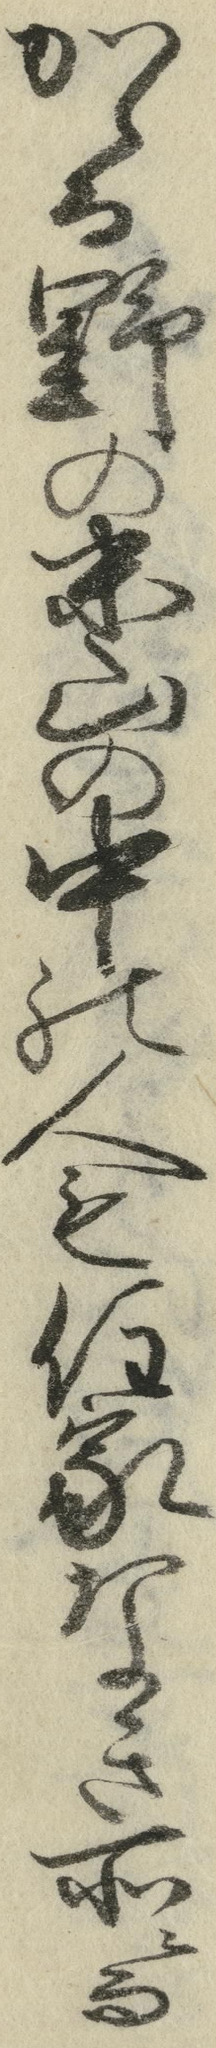かゝる野の末山の中の人も住家なき所ニ而
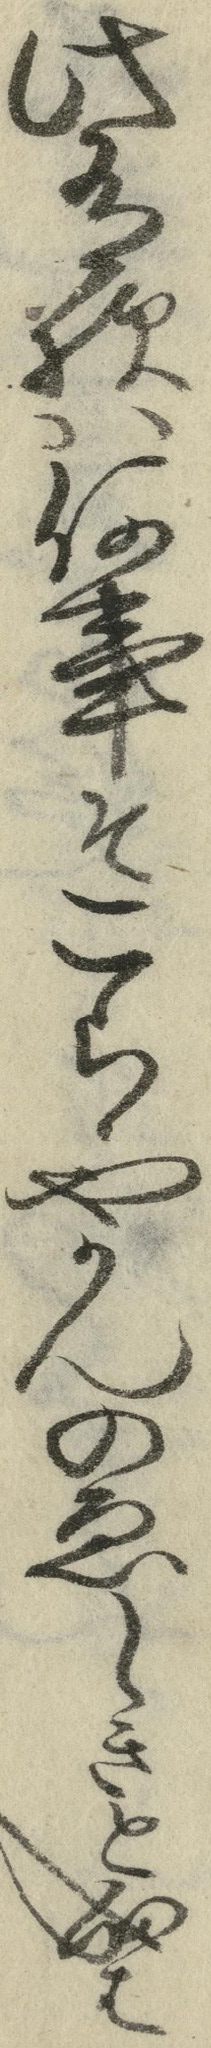此有様は何事そこららやかんのゑしきと成は
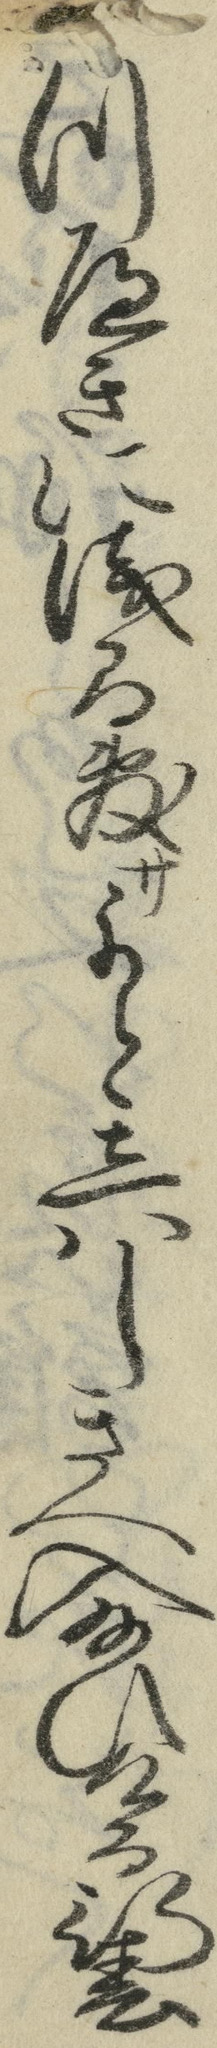つへきに浅間敷サよとしはしきへ入給ひける行春
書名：浅間記
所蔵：東京大学地震研究所図書室 Earthquake Research Institute Library, The University of Tokyo, JAPAN
